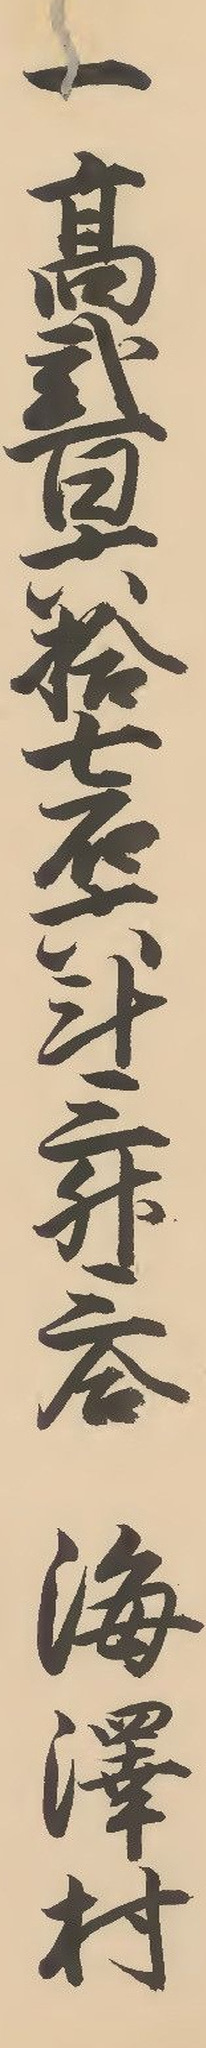一高弐百六拾七石六斗三升三合海澤村
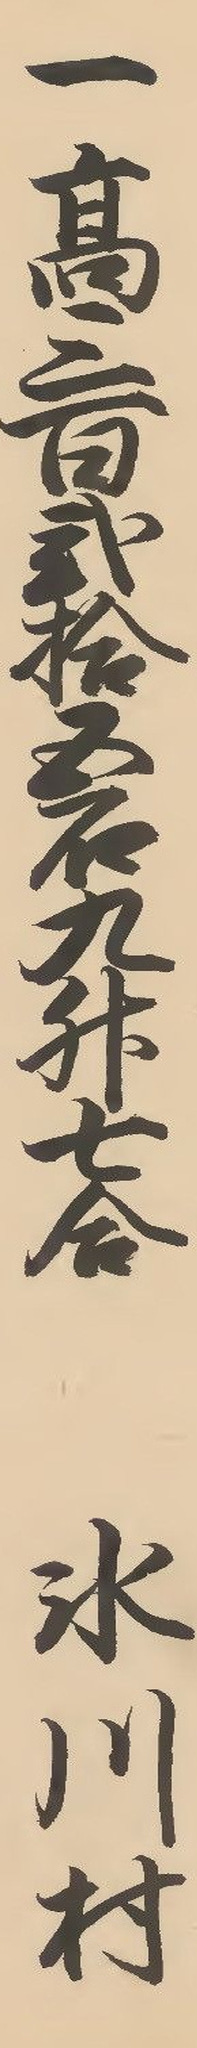一高三百弐拾五石九升七合氷川村
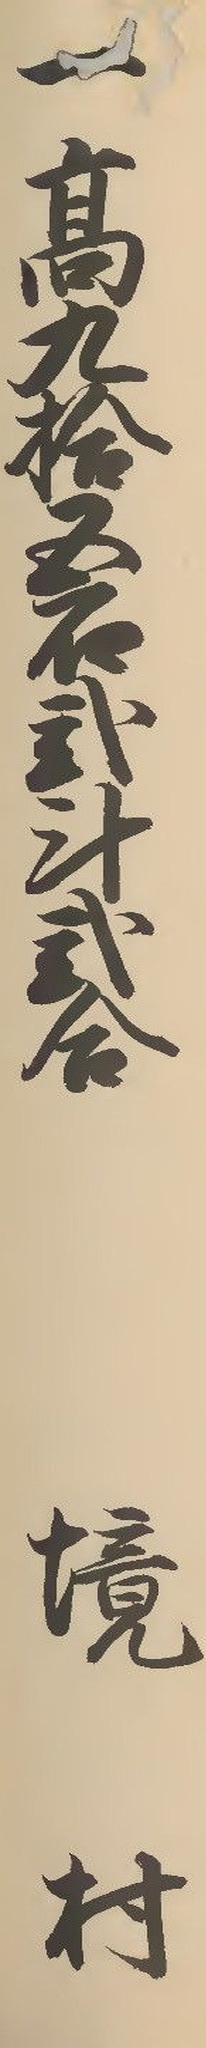一高九拾五石弐斗弐合境村
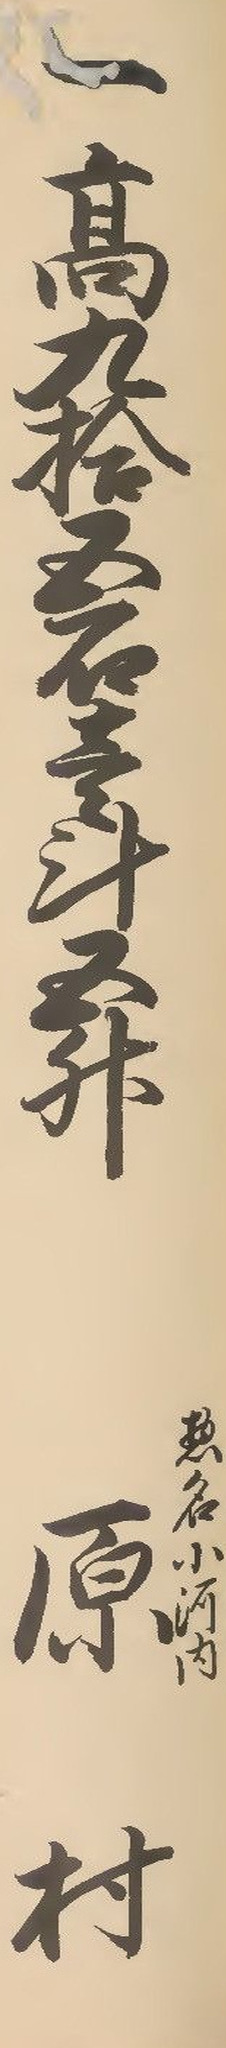一高九拾五石壱斗五升原村
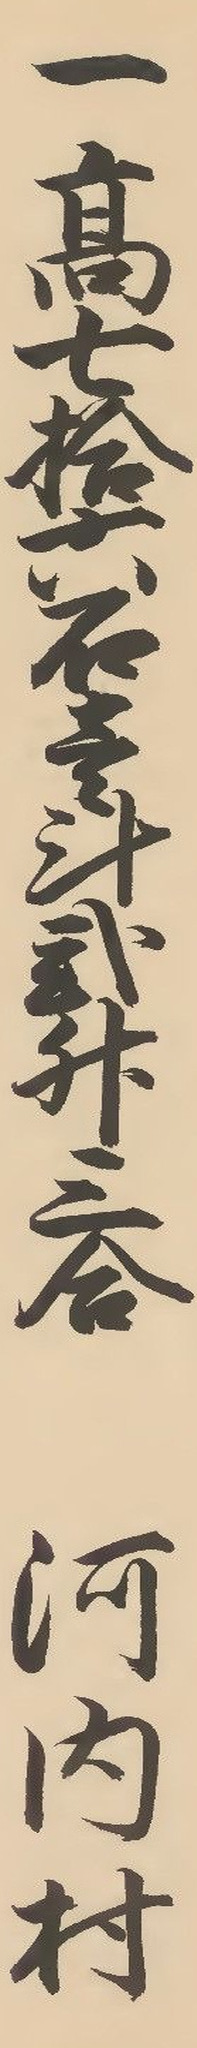一高七拾六石壱斗弐升三合河内村
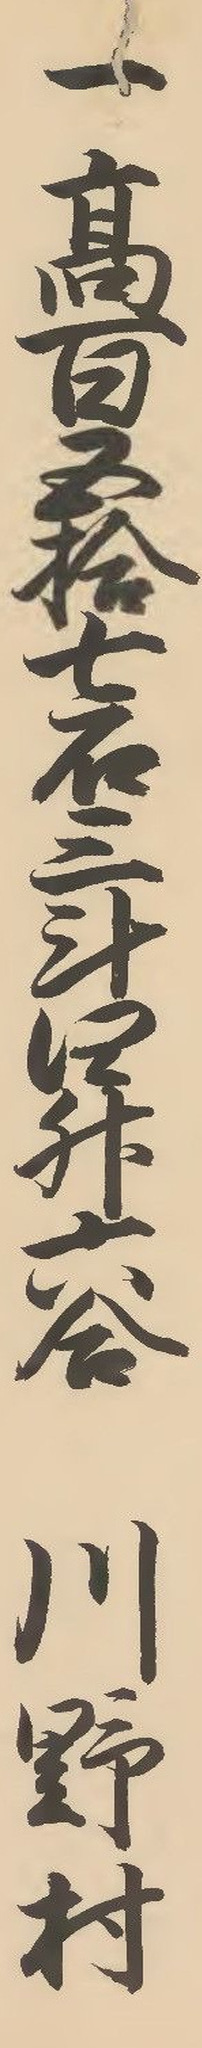一高百五拾七石三斗四升六合川野村
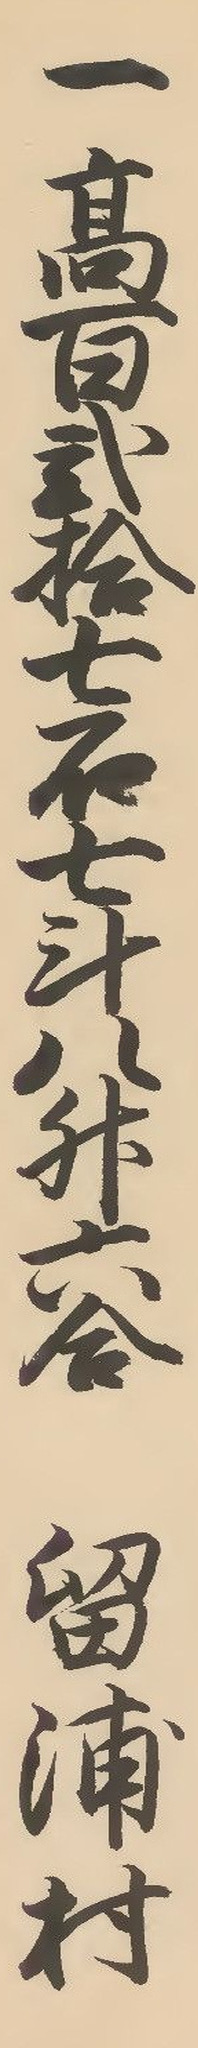一高百弐拾七石七斗八升六合留浦村

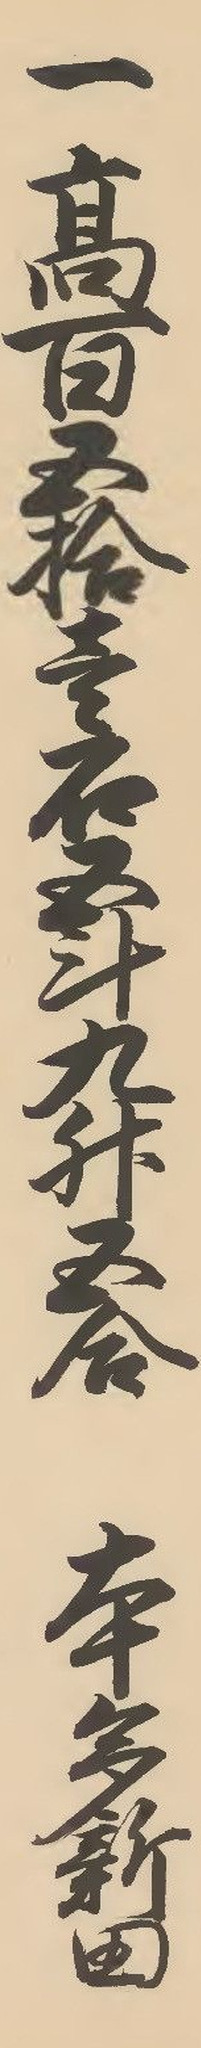一高百五拾壱石五斗九升五合本多新田
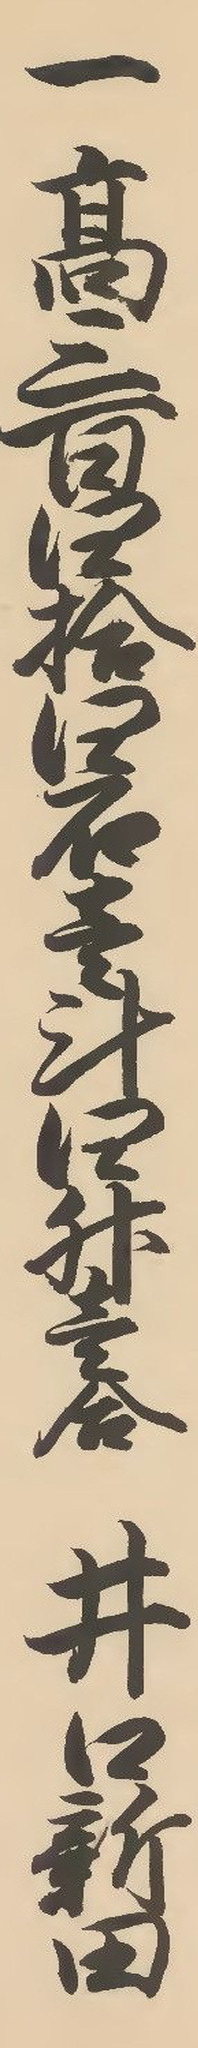一高三百四拾四石壱斗四升壱合井口新田
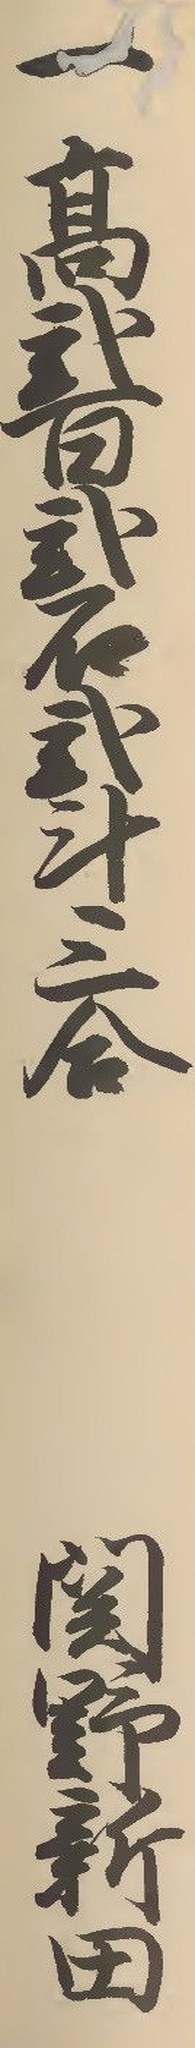一高弐百弐石弐斗三合関野新田
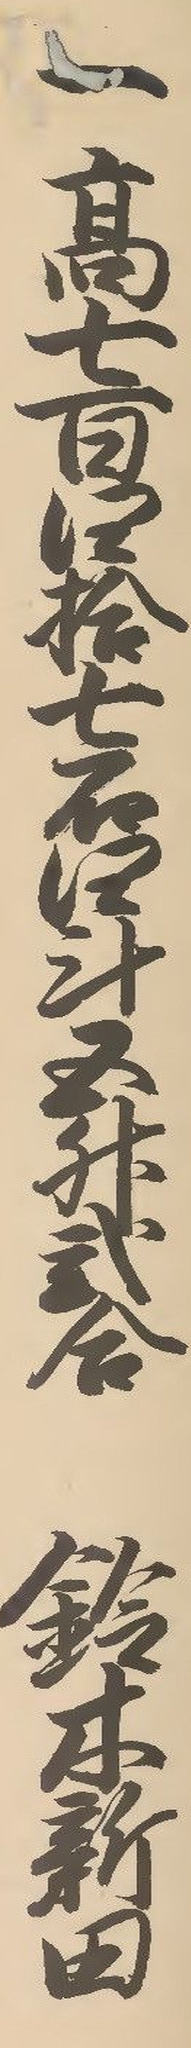一高七百四拾七石四斗五升弐合鈴木新田
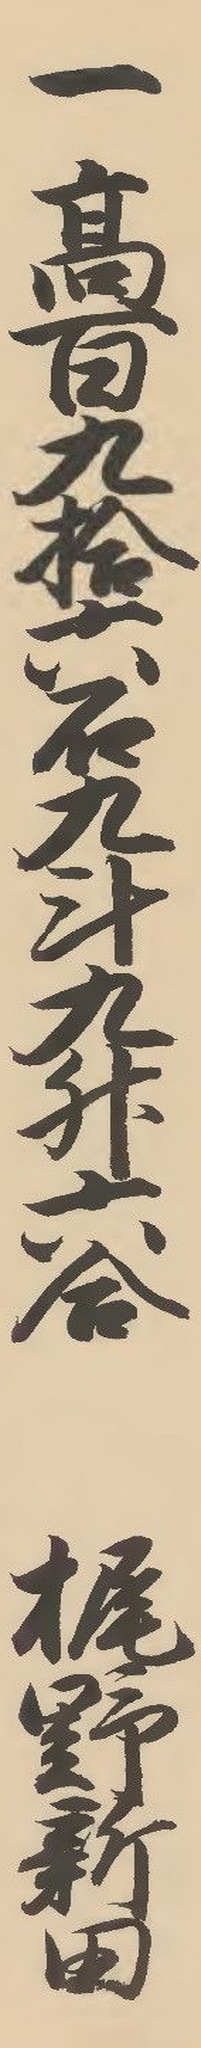一高百九拾六石九斗九升六合梶野新田
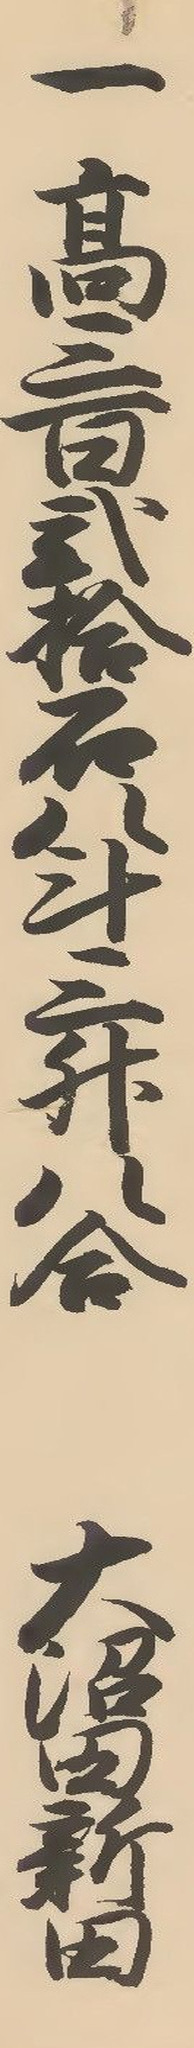一高三百弐拾石八斗三升八合大沼田新田
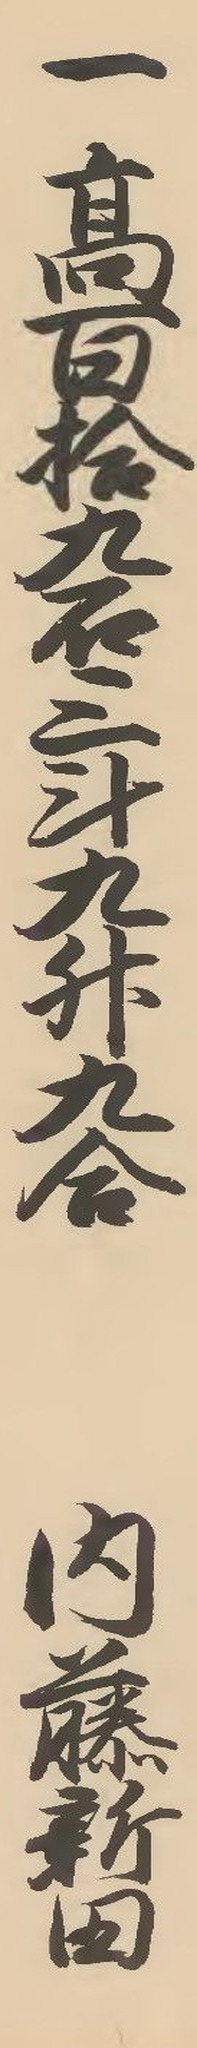一高百拾九石三斗九升九合内藤新田

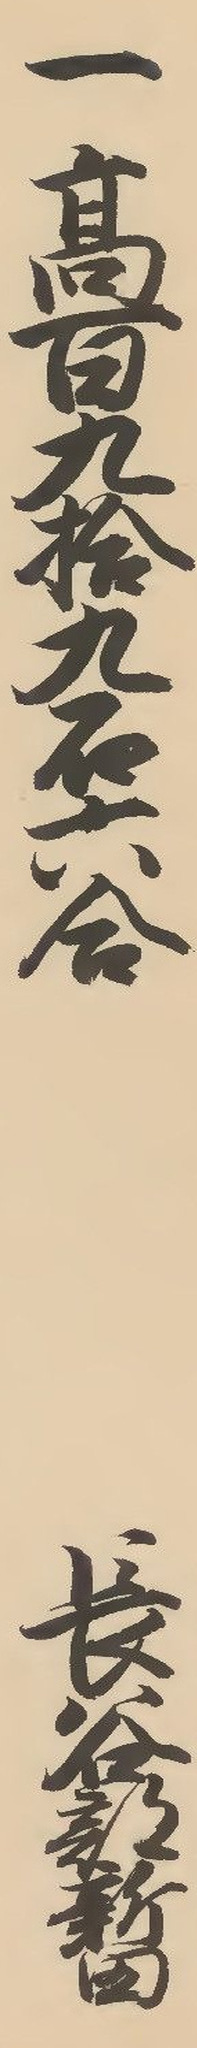一高百九拾九石六合長谷部新田
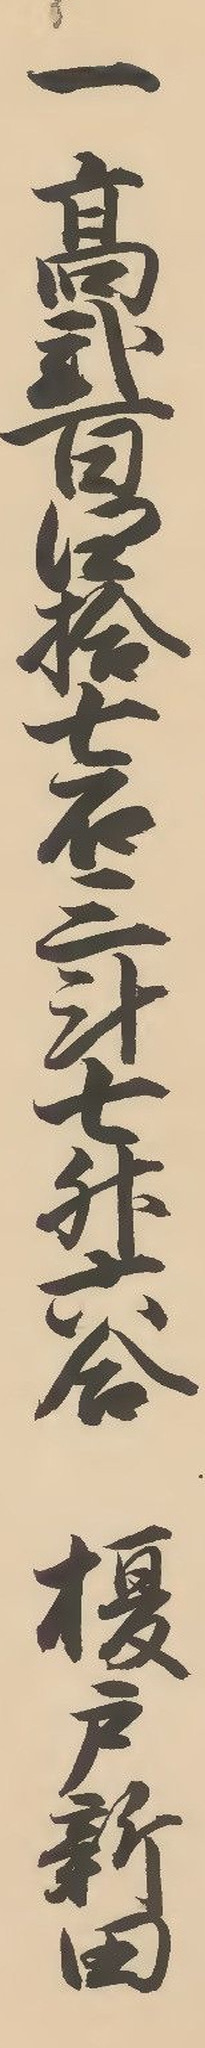一高弐百四拾七石三斗七升六合榎戸新田
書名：武蔵国郷帳　上
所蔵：国立公文書館 National Archives of Japan
